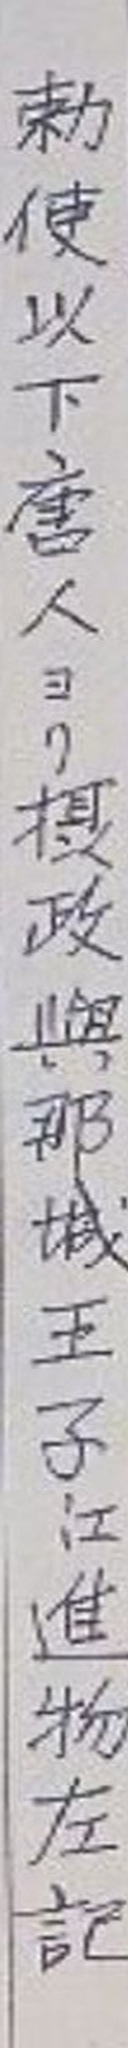勅使以下唐人より摂政与那城王子え進物左記
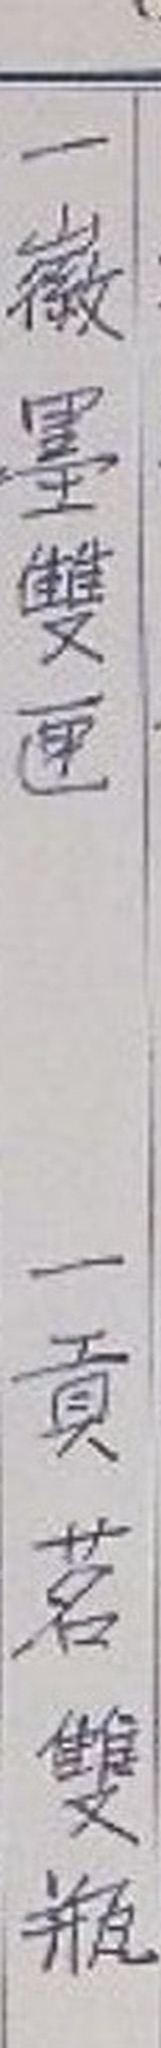一徽墨雙匣一貢茗雙瓶

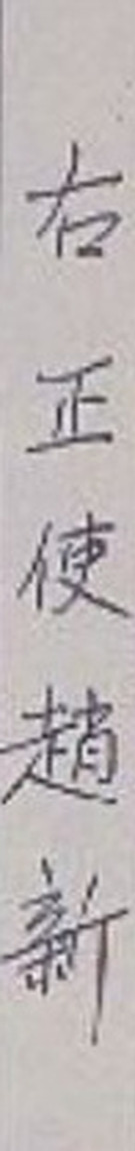右正使趙新
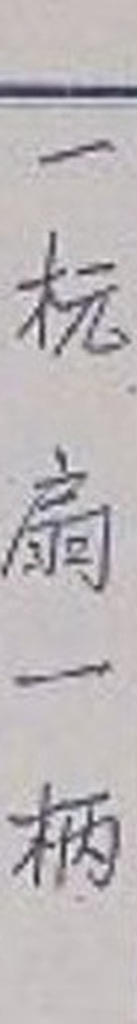一杭扇一柄一楹聯一副
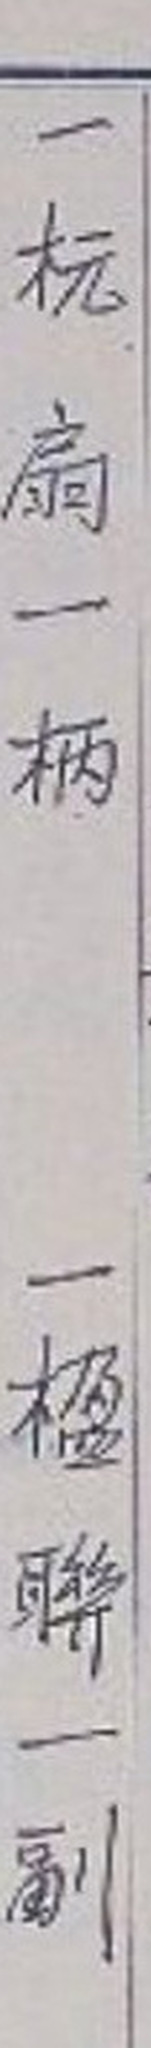一杭扇一柄一楹聯一副
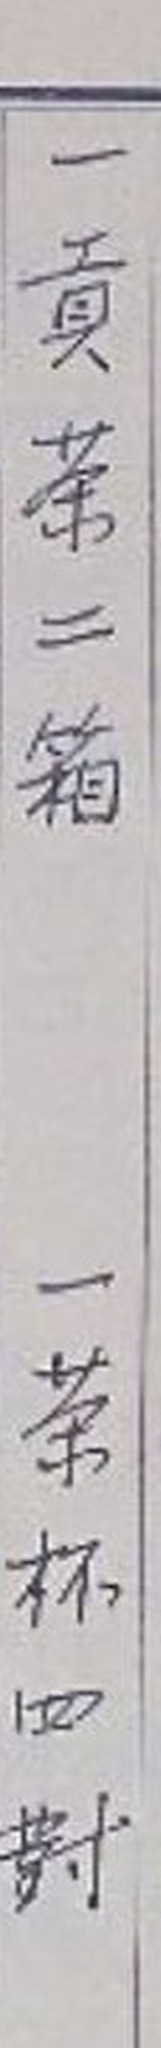一貢茶二箱一茶杯四対
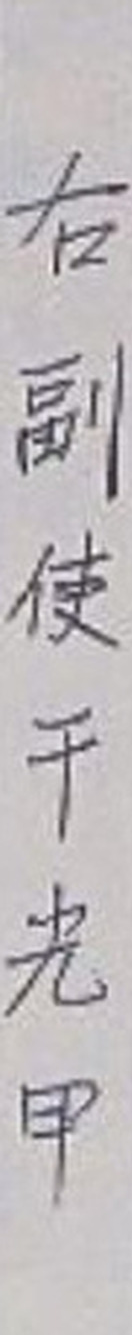右副使千光甲
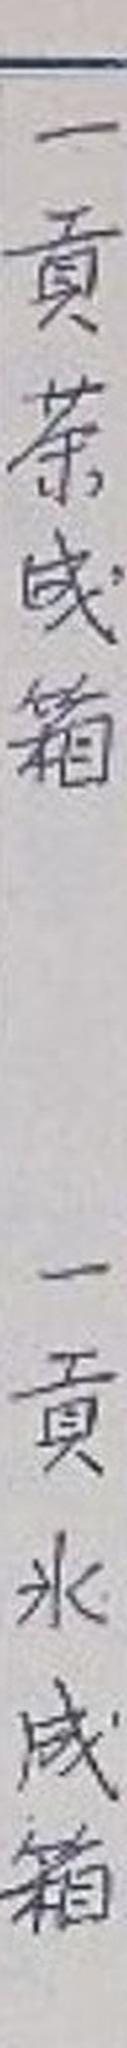一貢茶成箱一貢氷成箱
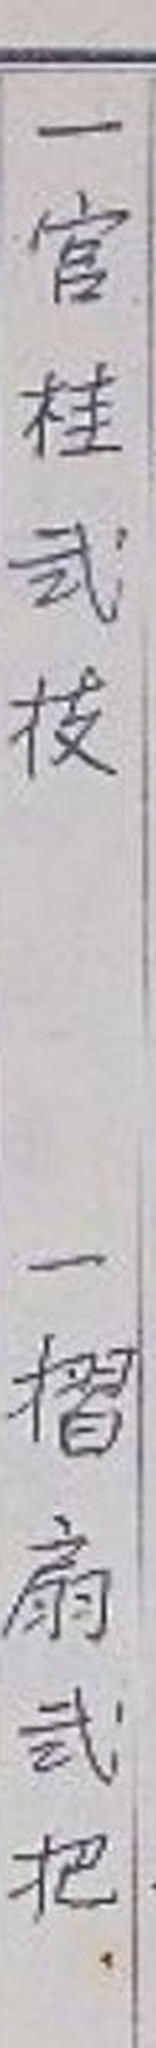一官桂弐枝一摺扇弐把
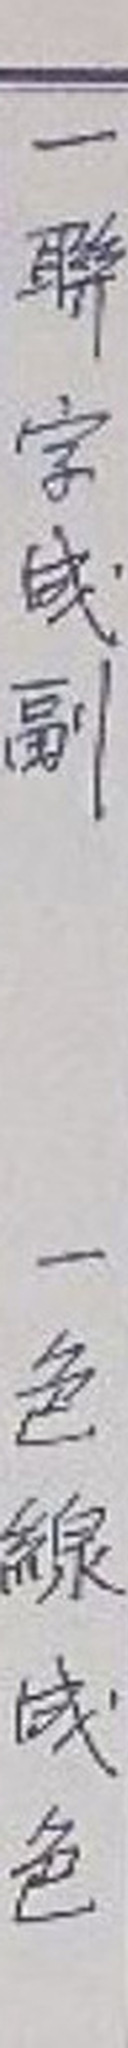一聯字成副一色線成色
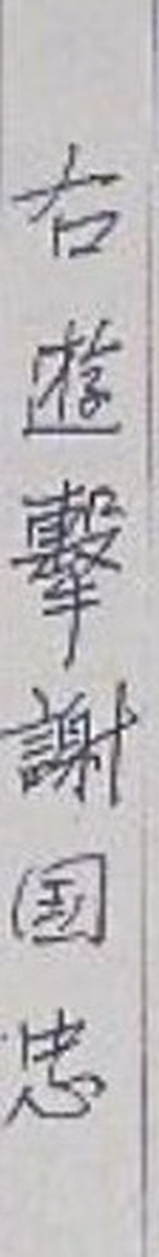右遊撃謝国忠
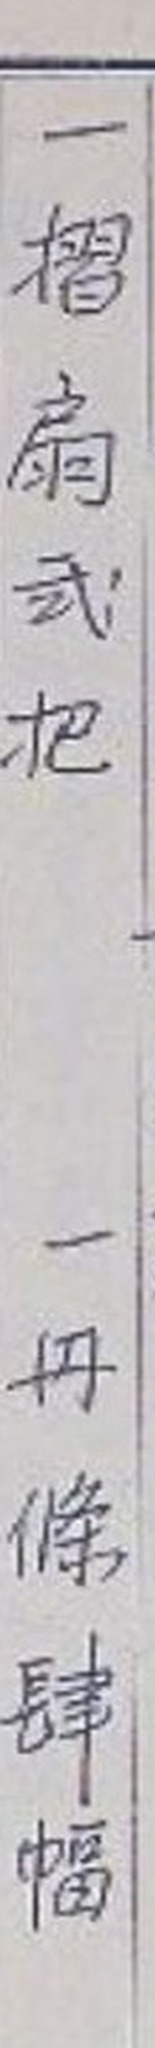一摺扇弐把一丹条肆幅
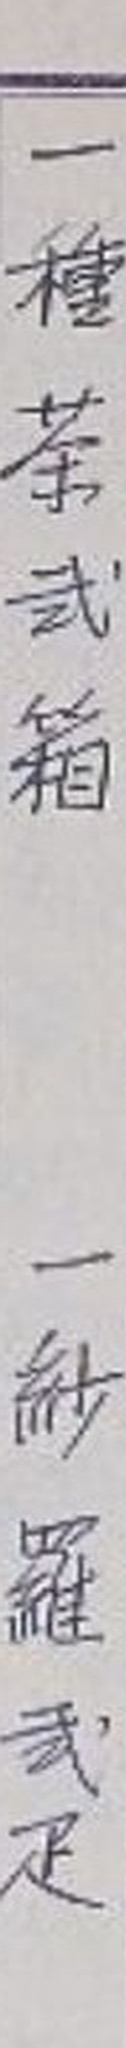一種茶弐箱一沙羅弐疋
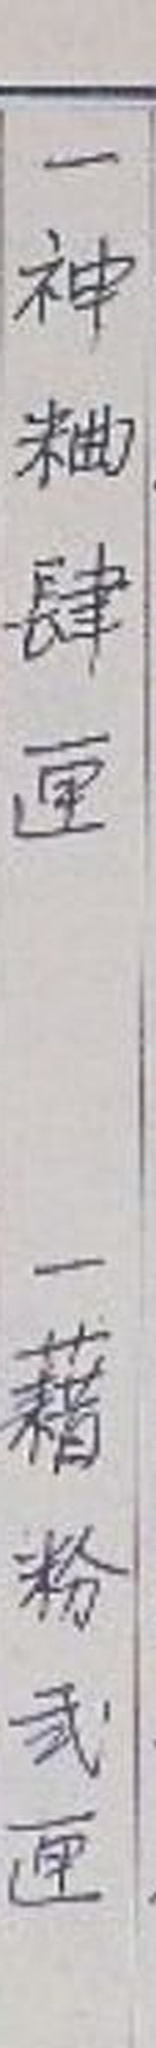一神粬肆匣一藉粉成匣
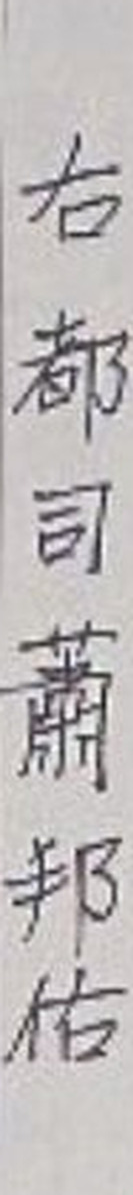右都司蕭邦佑
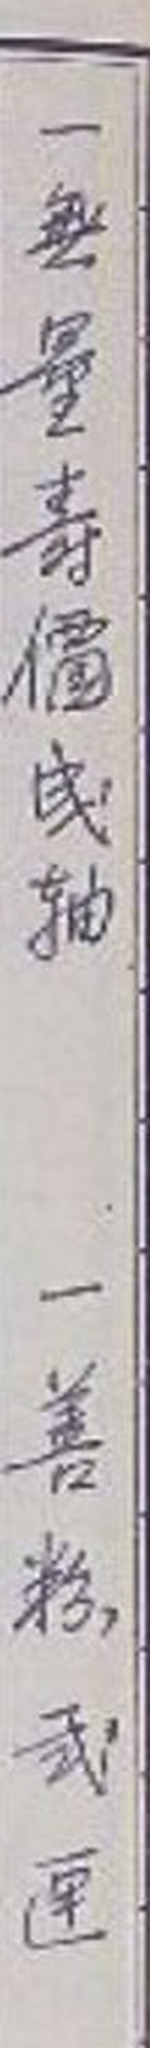一無量寿成軸一善粉弐匣
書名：支那冊封使来琉諸記 下巻
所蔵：University of the Ryukyus Library
